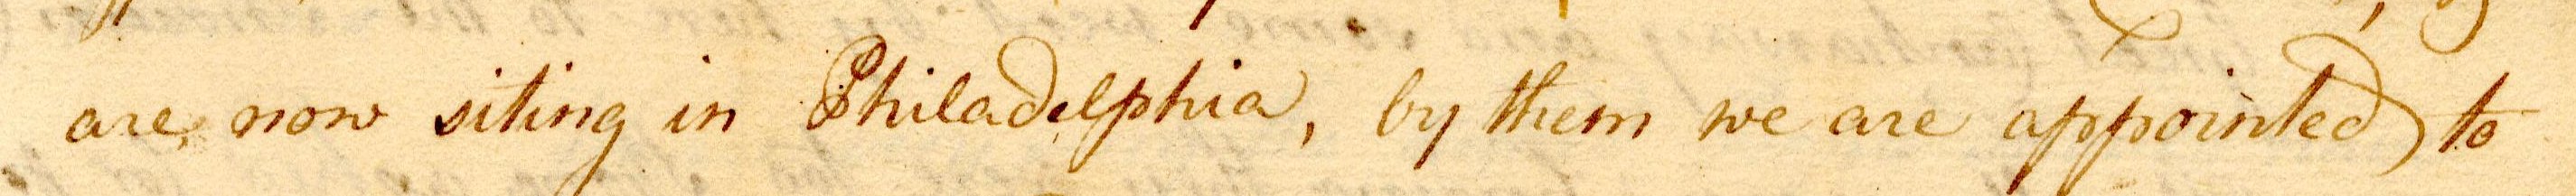are now siting in Philadelphia, by them we are appointed to
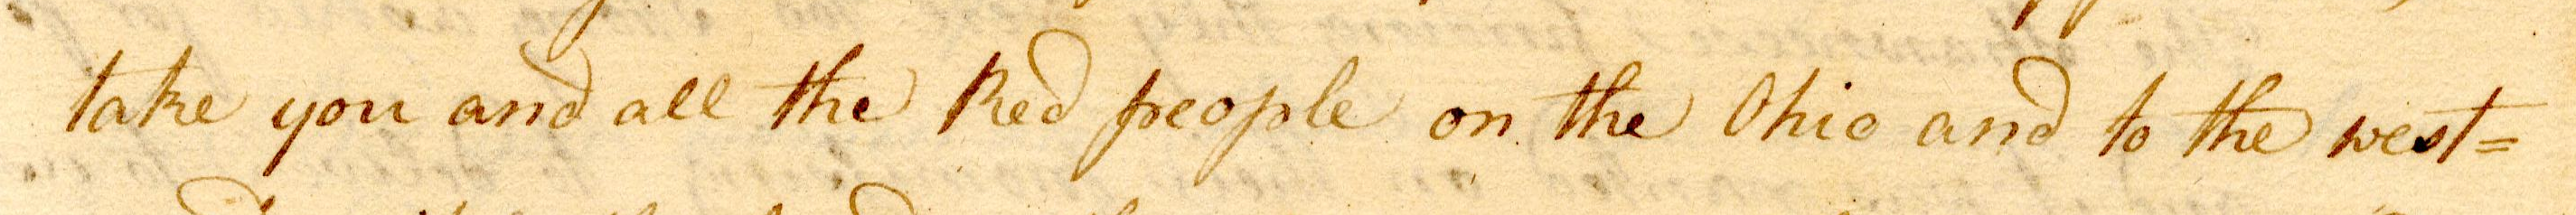take you and all the Red people on the Ohio and to the west-
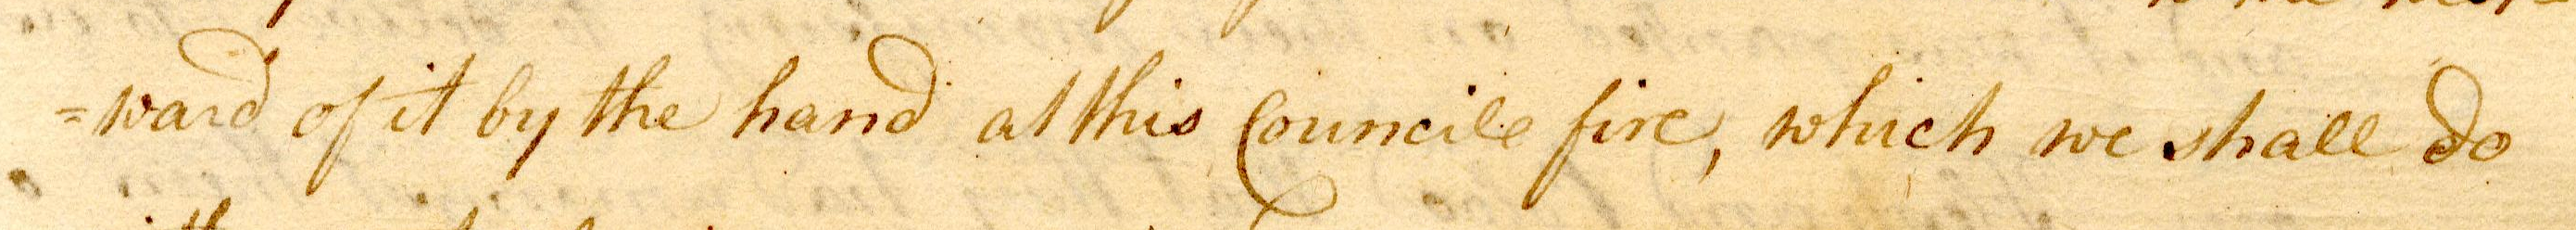-ward of it by the hand at this Council fire, which we shall do
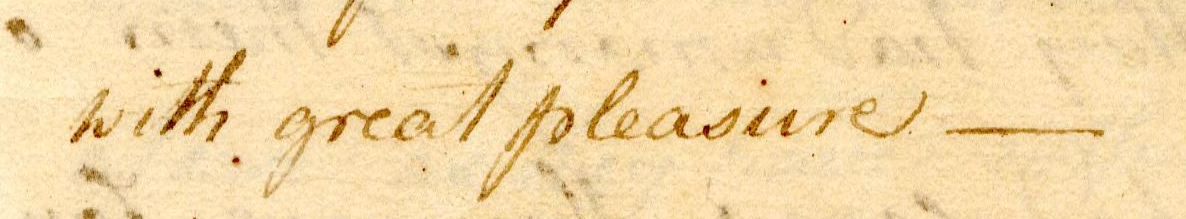with great pleasure-
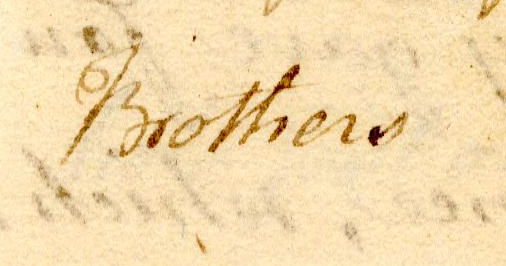Brothers
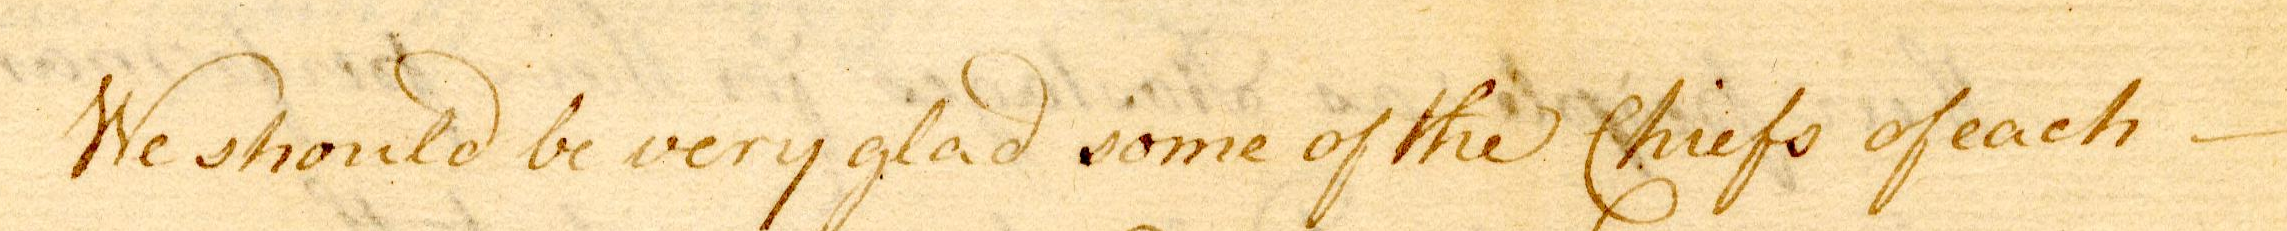We should be very glad some of the Chiefs of each-
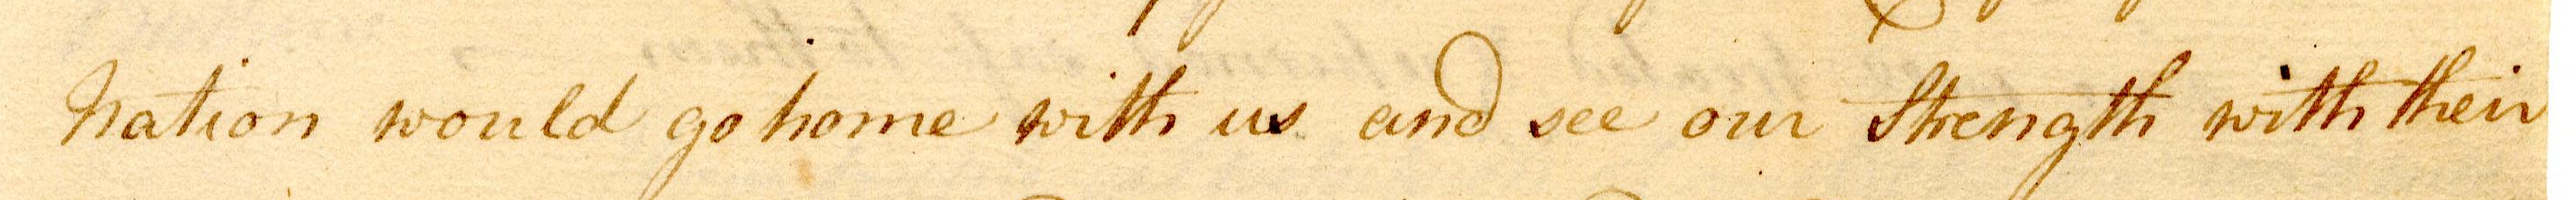Nation would go home with us and see our Strength with their
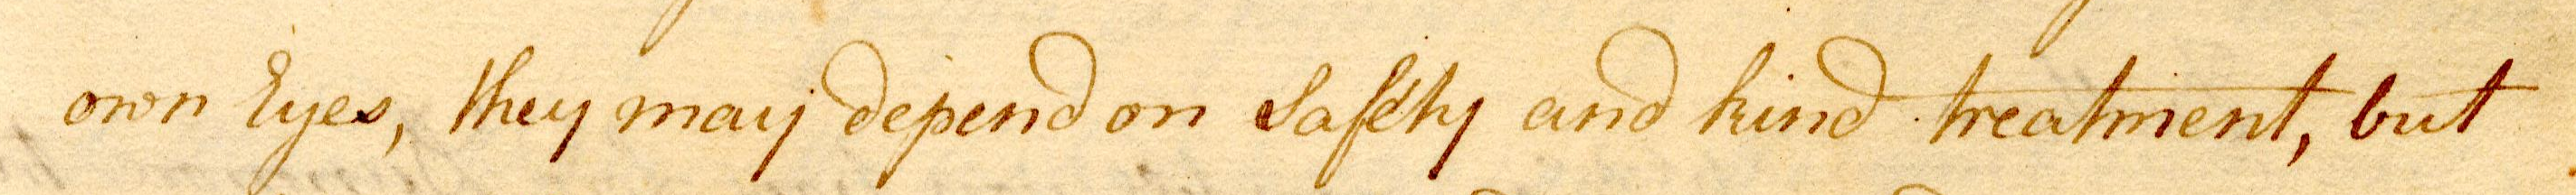own Eyes, they may depend on Safety and kind treatment, but
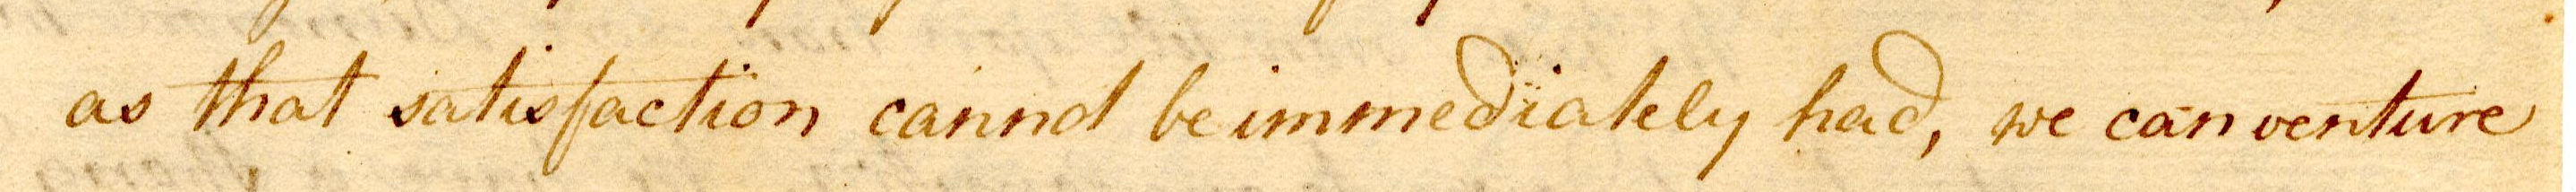as that satisfaction cannot be immediately had, we can venture
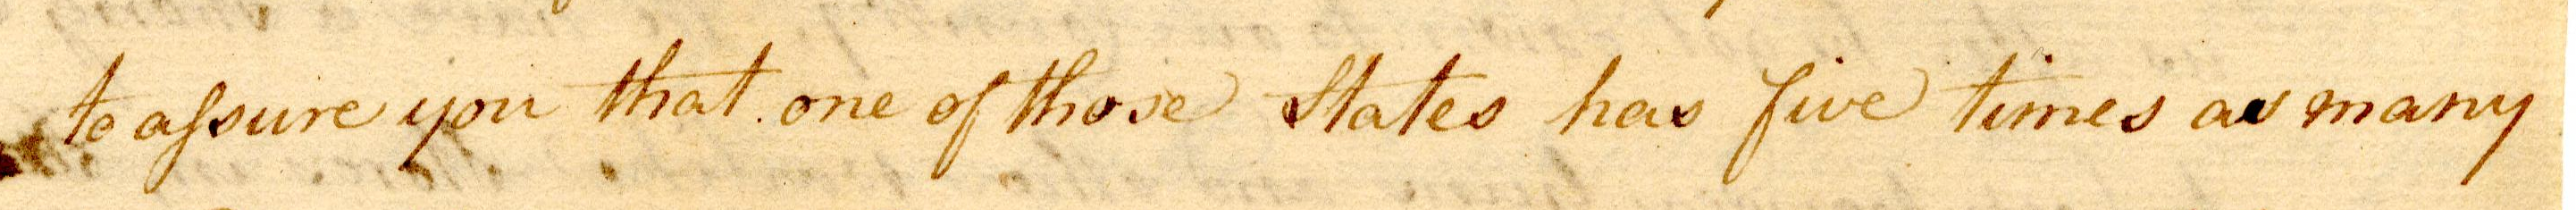to assure you that one of those States has five times as many
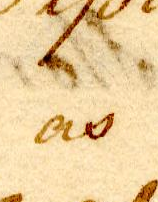as
